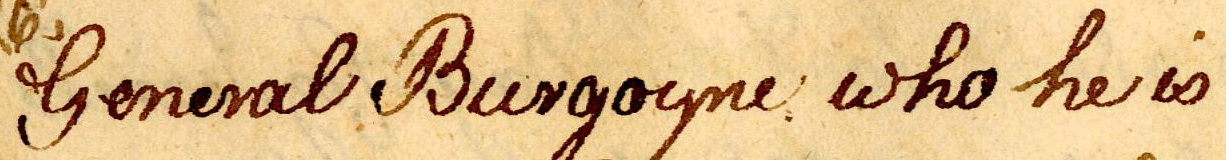General Burgoyne, who he is
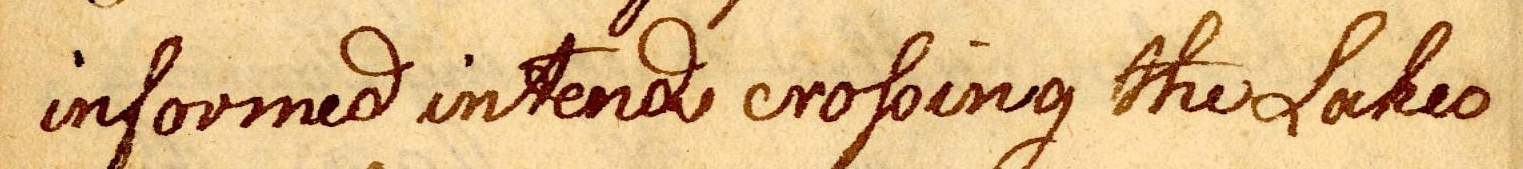informed intends crossing the Lakes
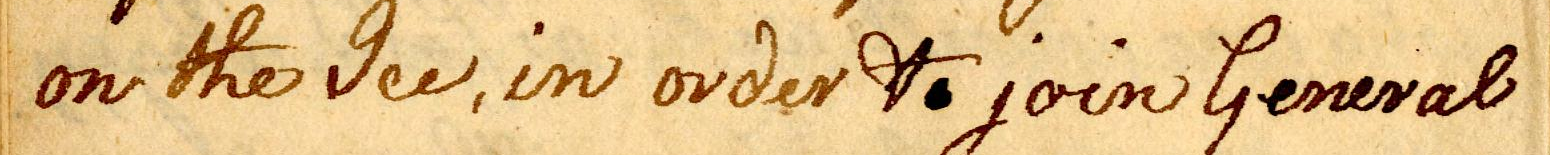on the Ice, in order to join General
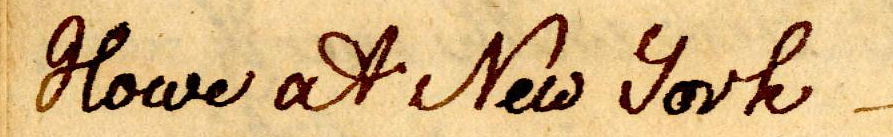Howe at New York-
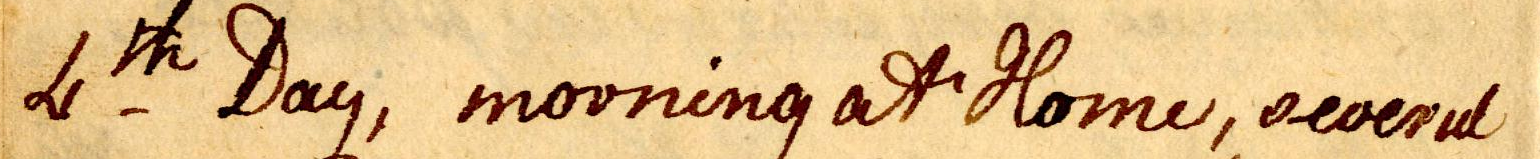4^th Day, morning at Home, several
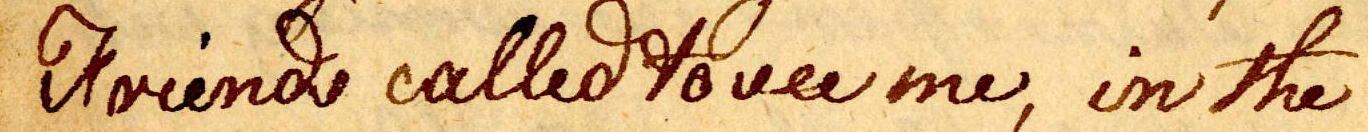Friends called to see me, in the
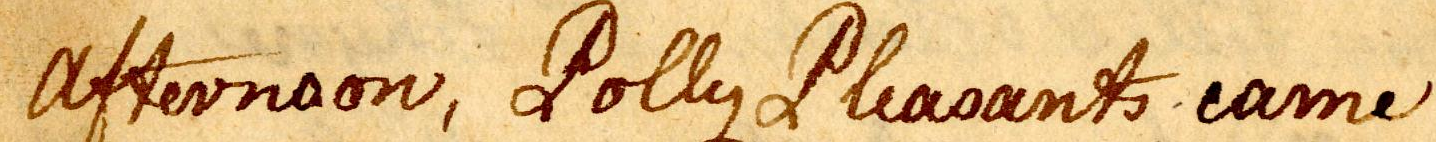Afternoon, Polly Pleasants came
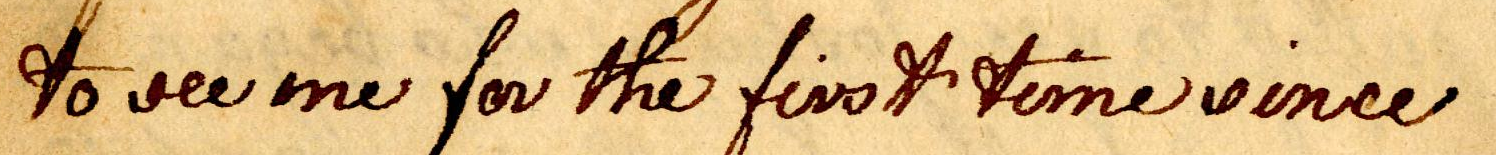to me for the first time since
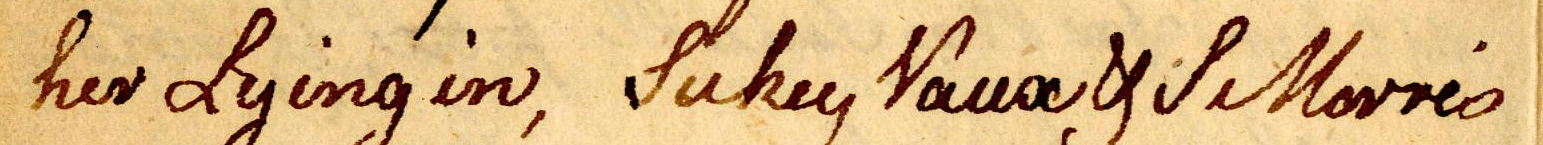her Lying in, Sukey Vaux & S Morris
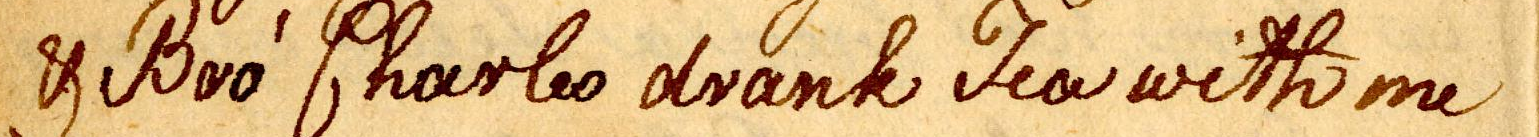& Bro' Charles drank Tea with me
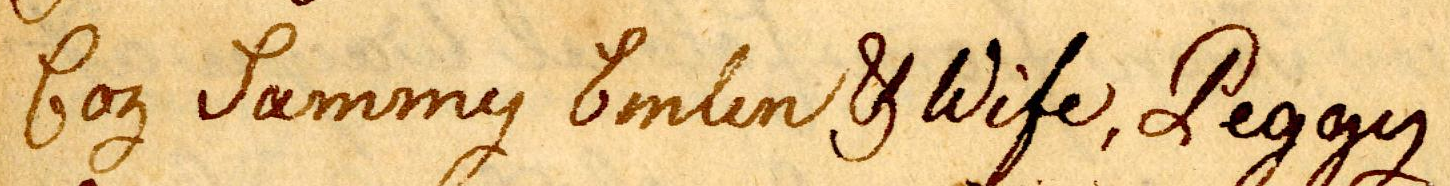Coz Sammy Emlen & Wife, Peggy
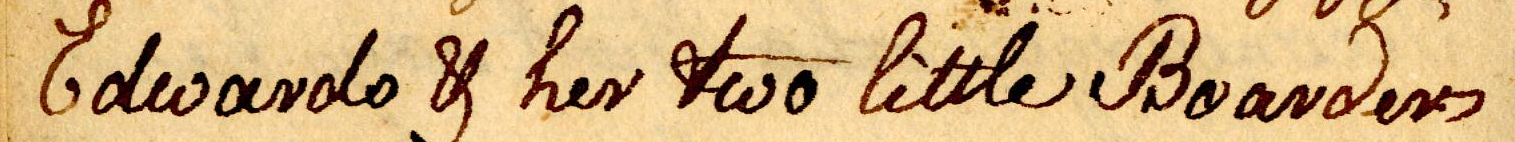Edwards & her two little Boarders
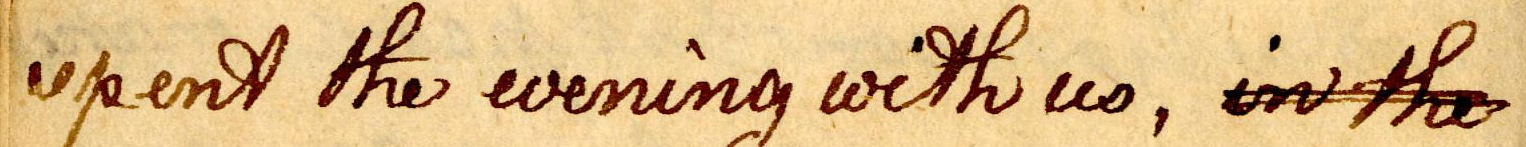spent the evening with us, [in the]
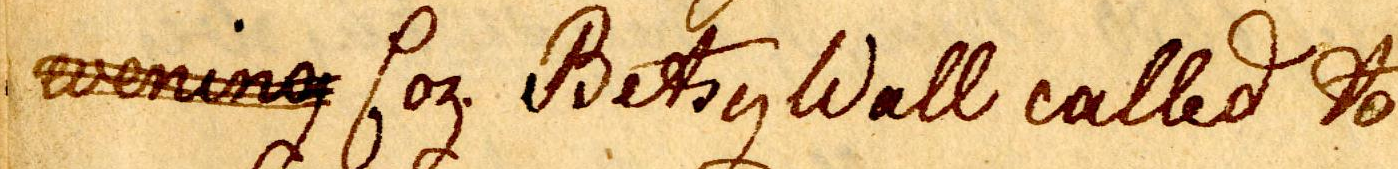[evening] Coz. Betsy Wall called to
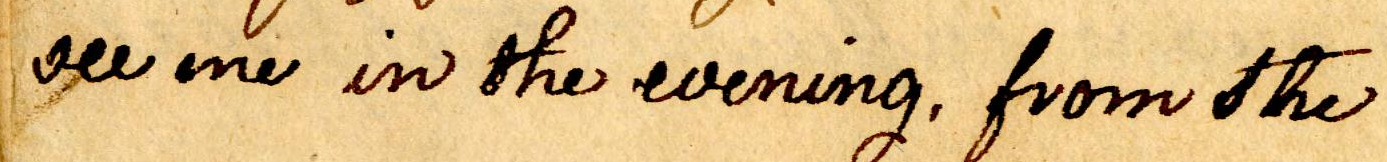see me in the evening. from the
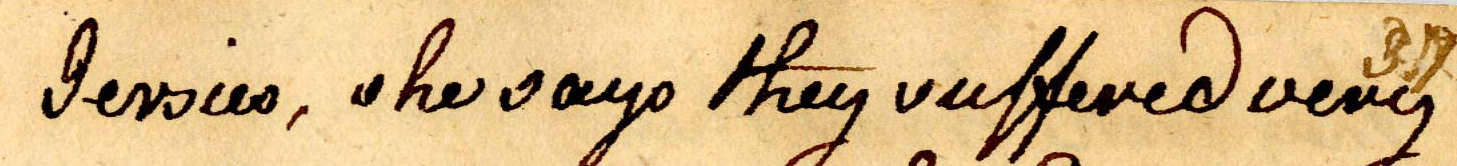Jersies, she says they suffered very
